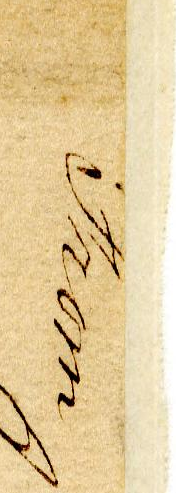From
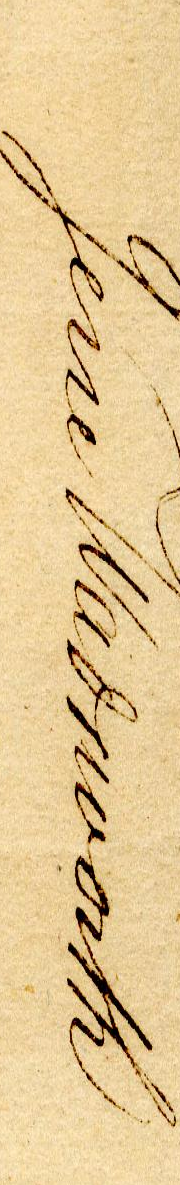Jere Wadsworth
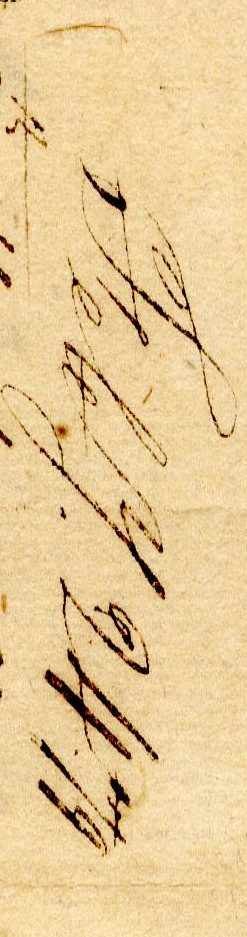Feb^y. 24^h. 79
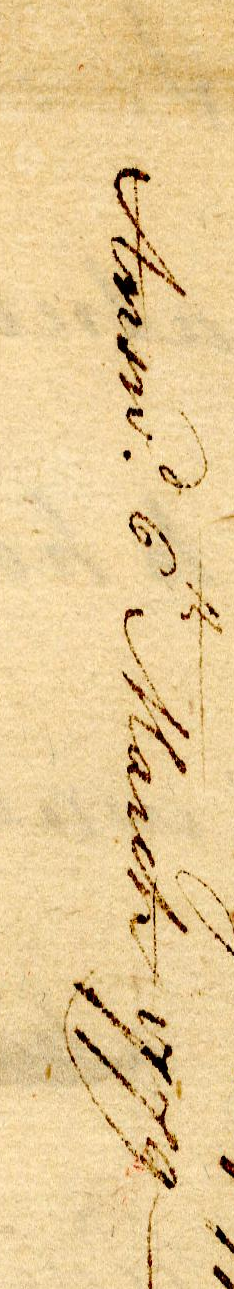Answ^d. 6^th March 1779
